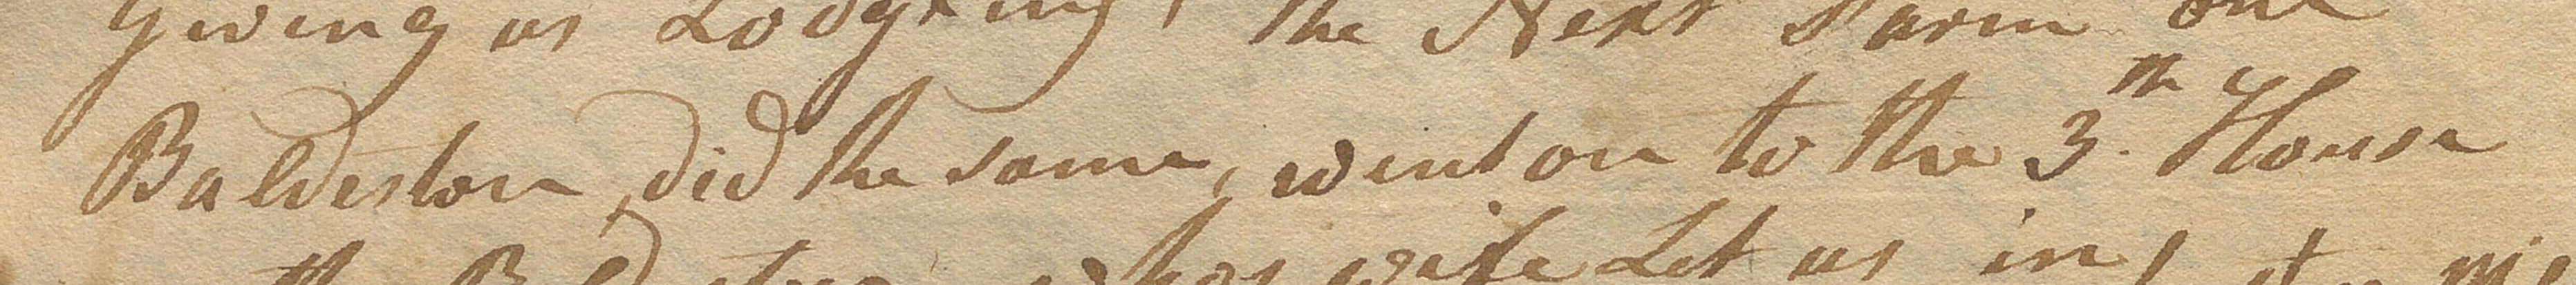Balderton did the same, went on to the 3^th. House
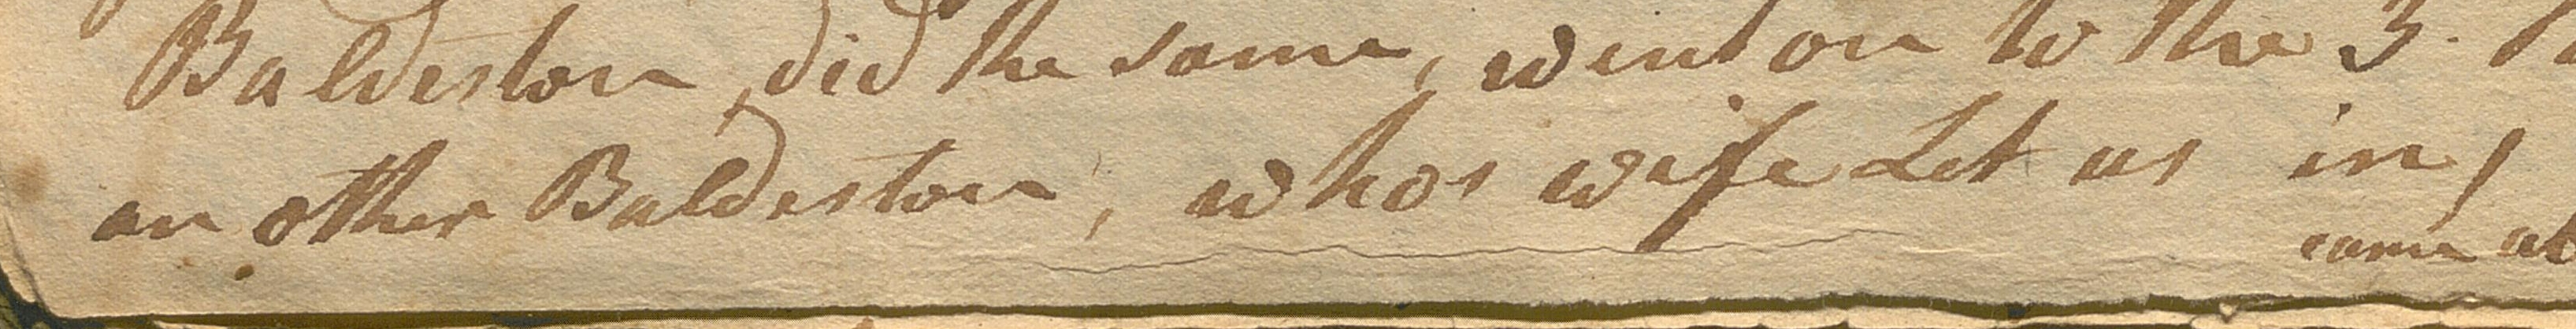an other Baldeston, whos wife Let us in
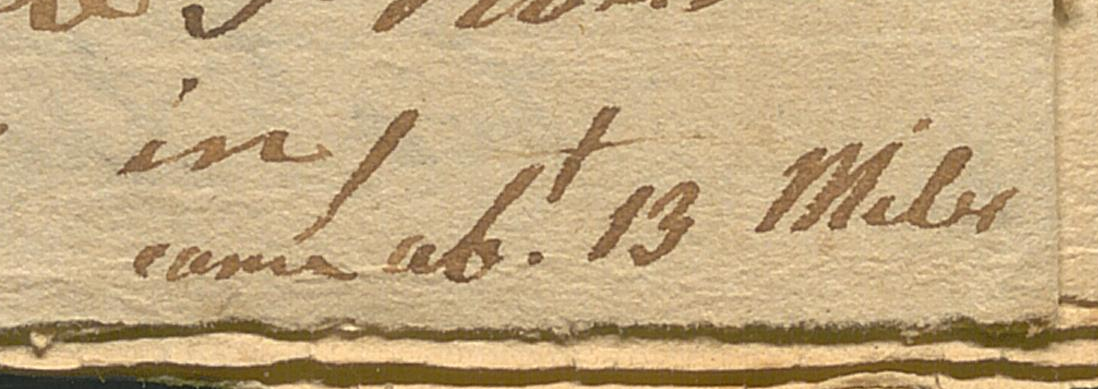came ab^t. 18 Miles
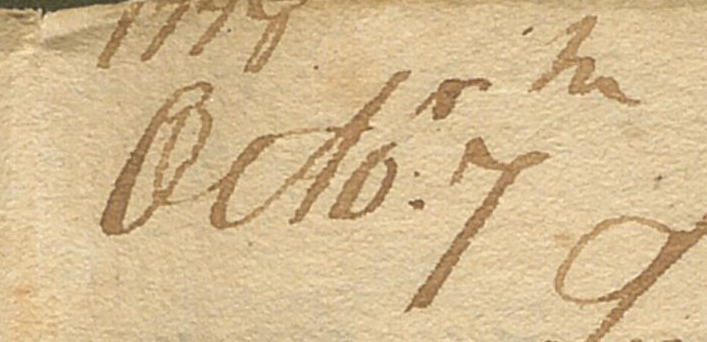Octo^r. 7^th
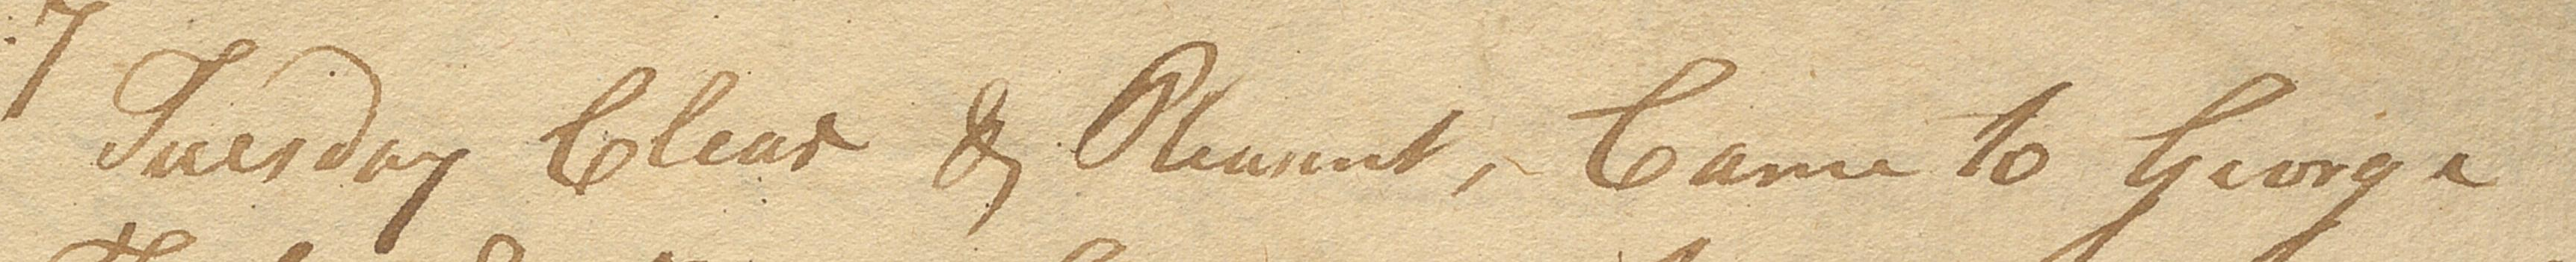Tuesday Clear & Pleasent, Came to George
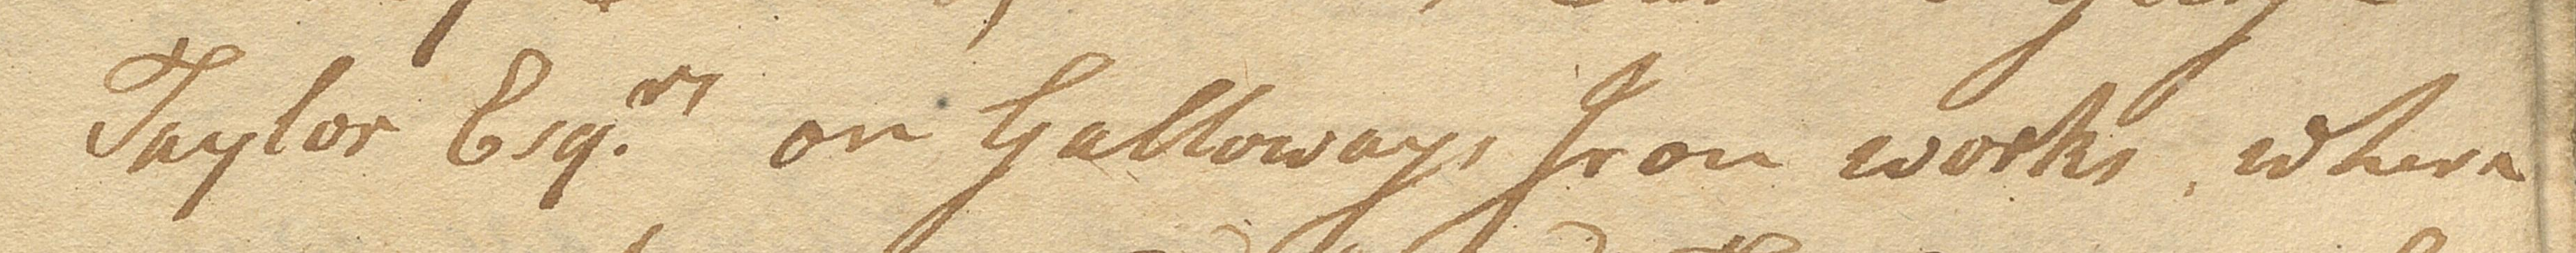Taylor Esq^rs. on Galloways Iron works, where
